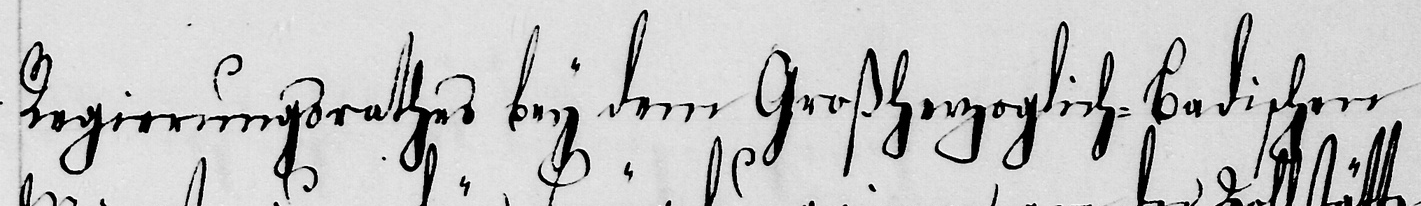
Regierungsrathes bey dem Großherzoglich-Badischen
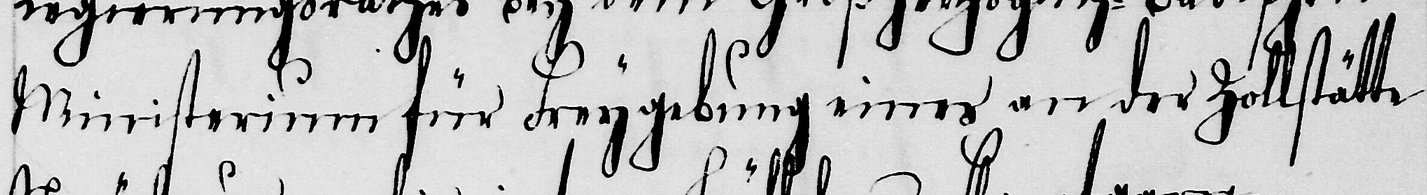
Ministerium für Freygebung eines an der Zollstätte
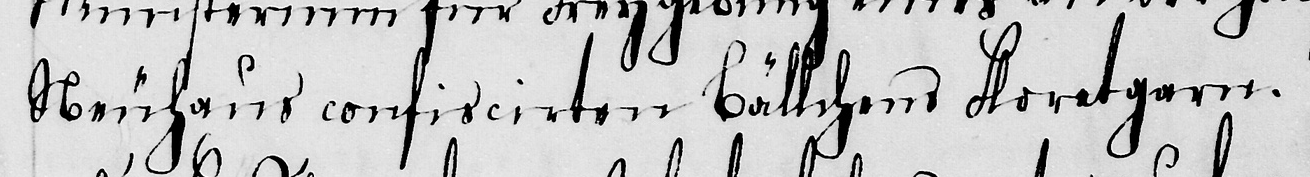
Neuhaus confiscirten Bällchens Floretgarn.
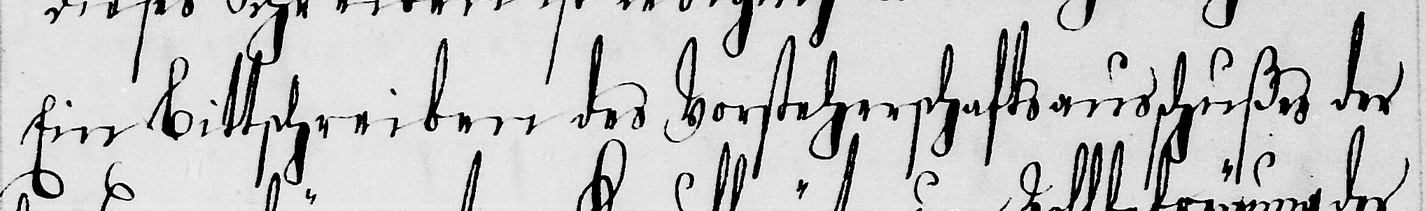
Ein Bittschreiben des Vorsteherschaftsausschußes der
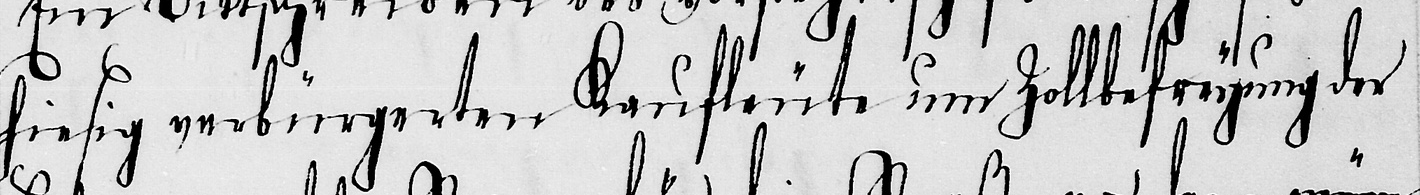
hiesig verbürgerten Kaufleute um Zollbefreyung der
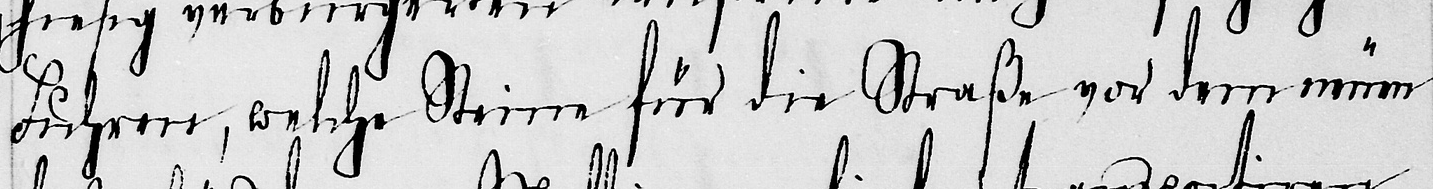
Fuhren, welche Steine für die Straße vor dem neuen
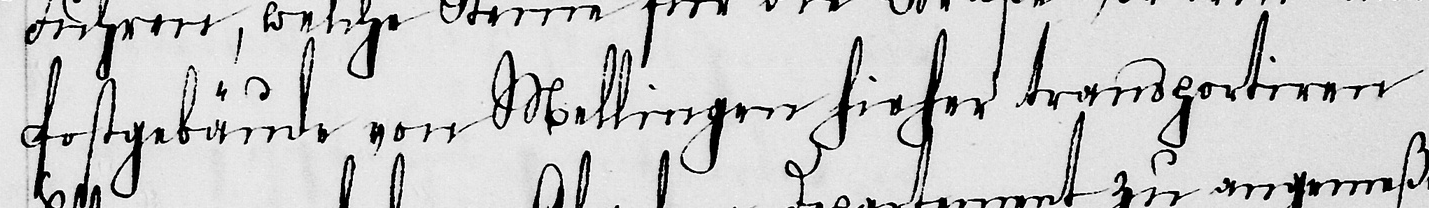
Postgebäude von Mellingen hieher transportiren
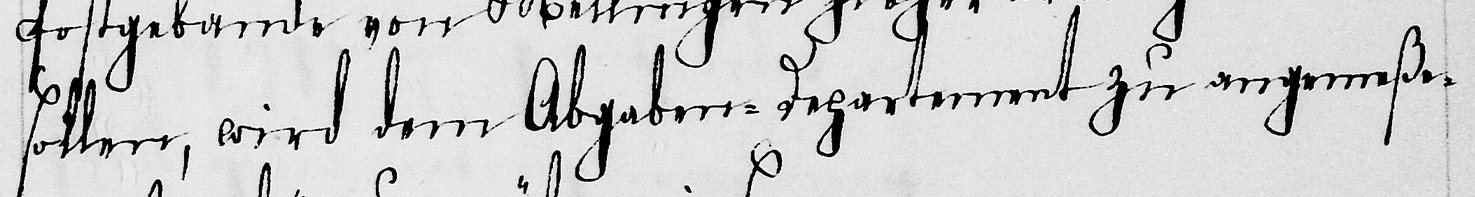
sollen, wird dem Abgaben-Departement zu angemeße¬
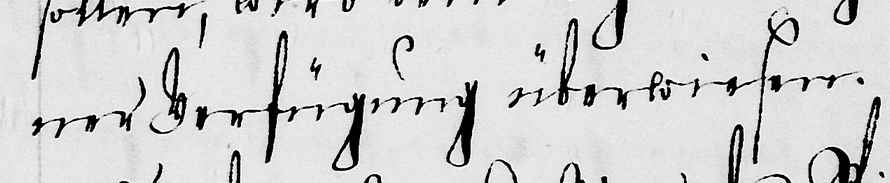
ner Verfügung überwiesen.
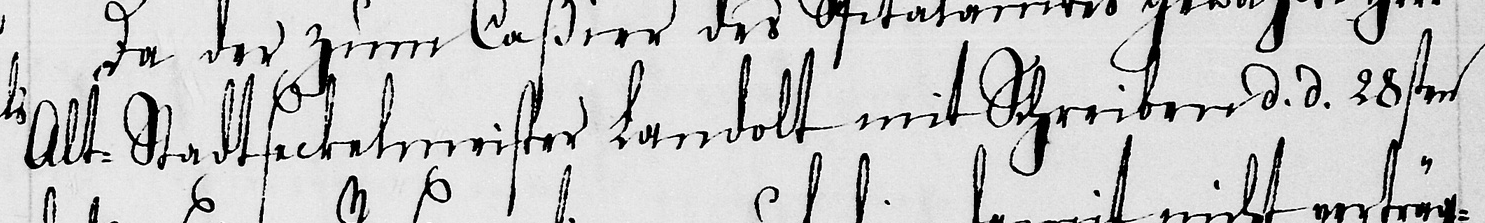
Alt-Stadtseckelmeister Landolt mit Schreiben d. d. 28sten
